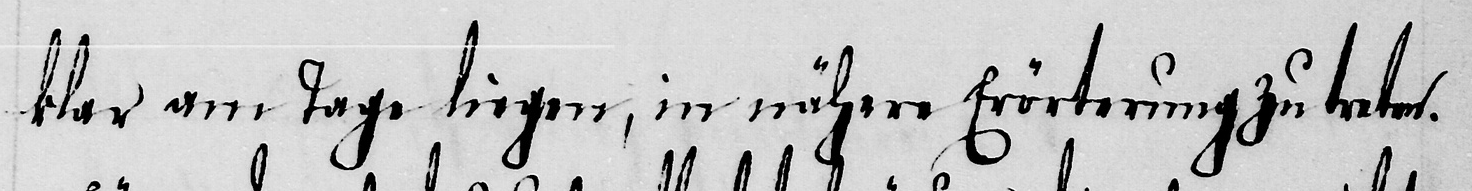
klar am Tage liegen, in nähere Erörterung zu treten.
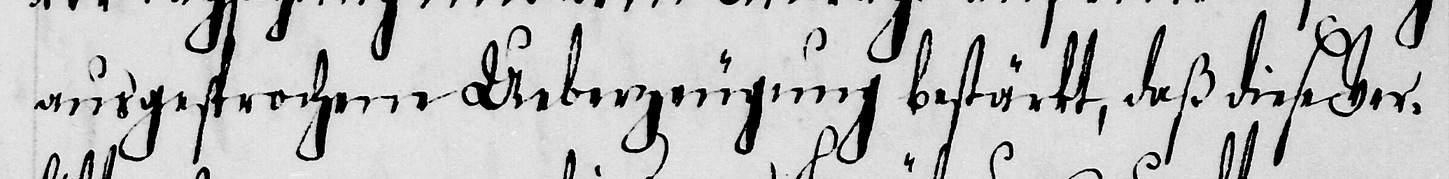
ausgesprochene Ueberzeugung bestärkt, daß diese Ver¬
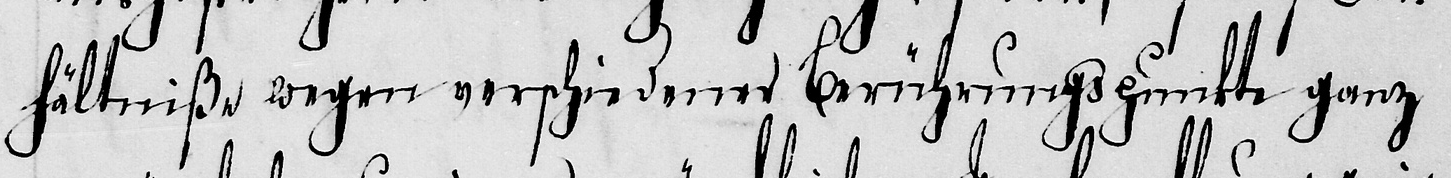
hältniße wegen verschiedener Berührungspunkte ganz
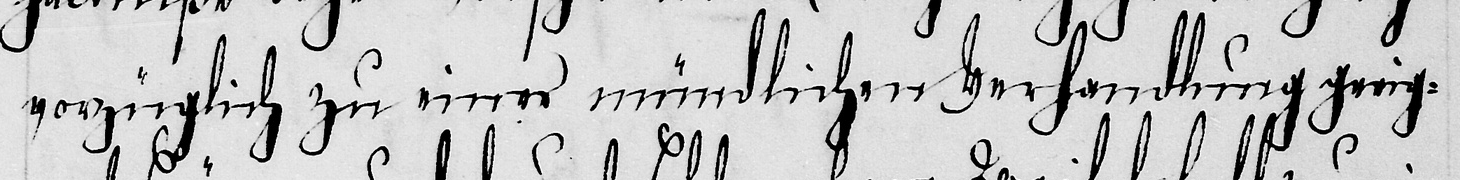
vorzüglich zu einer mündlichen Verhandlung geeig¬
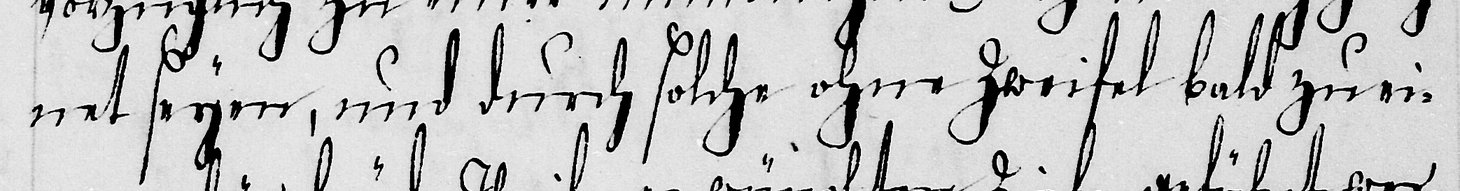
net seyen, und durch solche ohne Zweifel bald zu ei¬
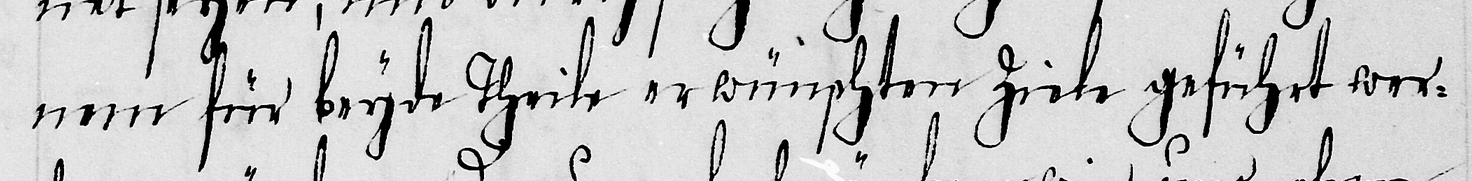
nem für beyde Theile erwünschten Ziele geführt wer¬
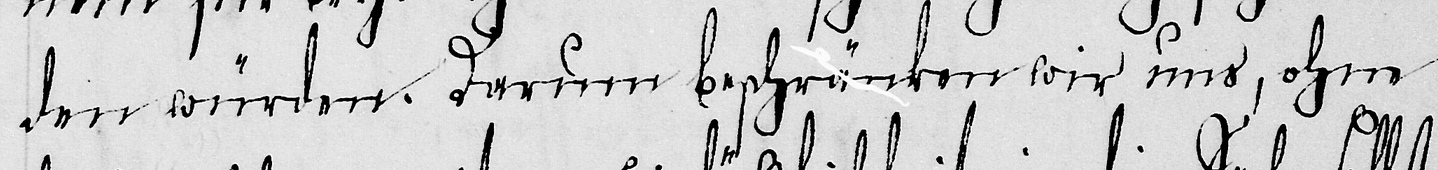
den würden. Darum beschränken wir uns, ohne
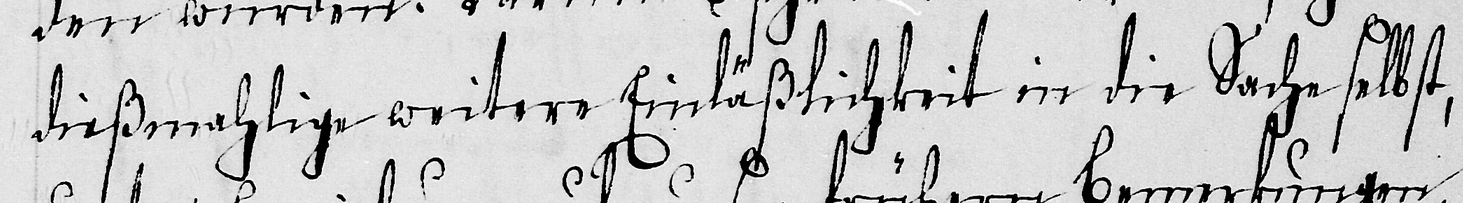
dießmahlige weitere Einläßlichkeiten in die Sache selbst,
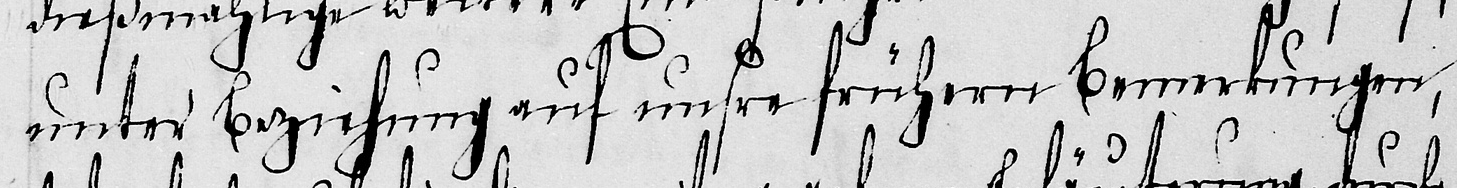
unter Beziehung auf unsre frühern Bemerkungen,
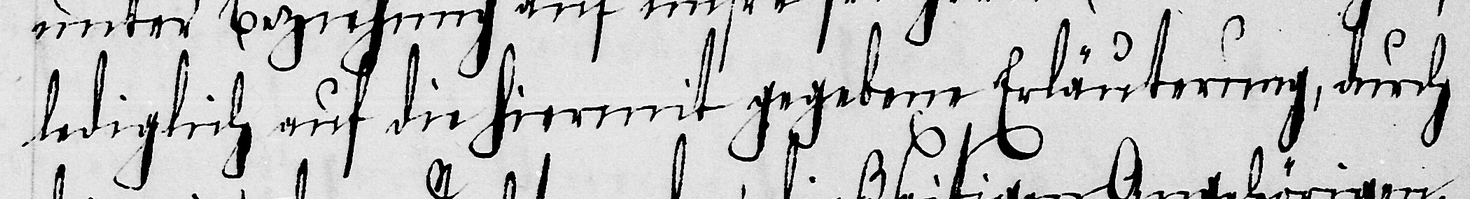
lediglich auf die hiermit gegebene Erläuterung, durch
